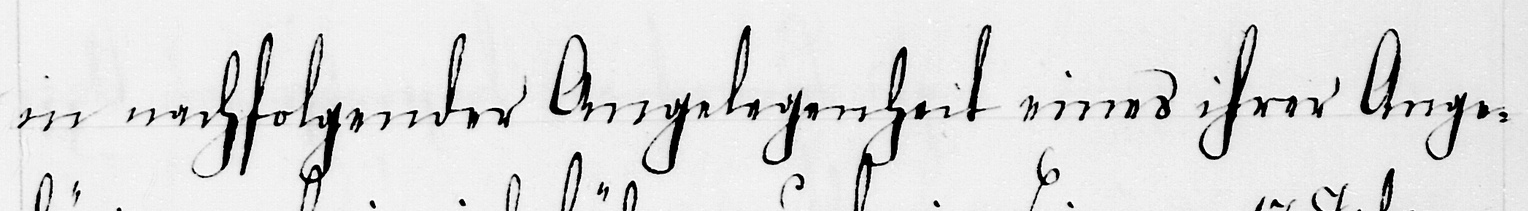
in nachfolgender Angelegenheit eines ihrer Ange¬
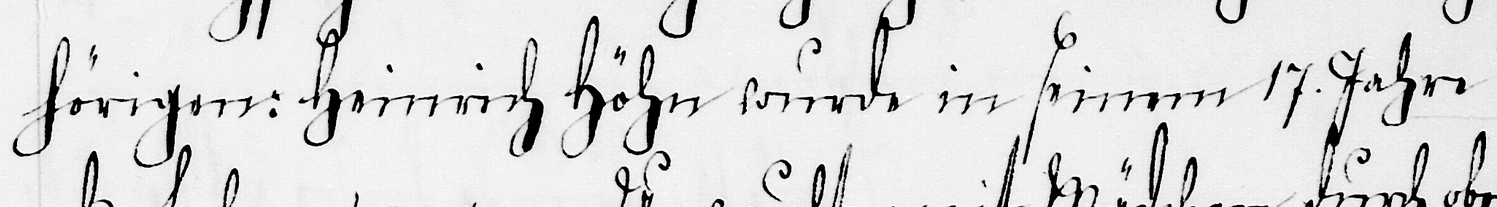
hörigen: Heinrich Höhn wurde in seinem 17. Jahre
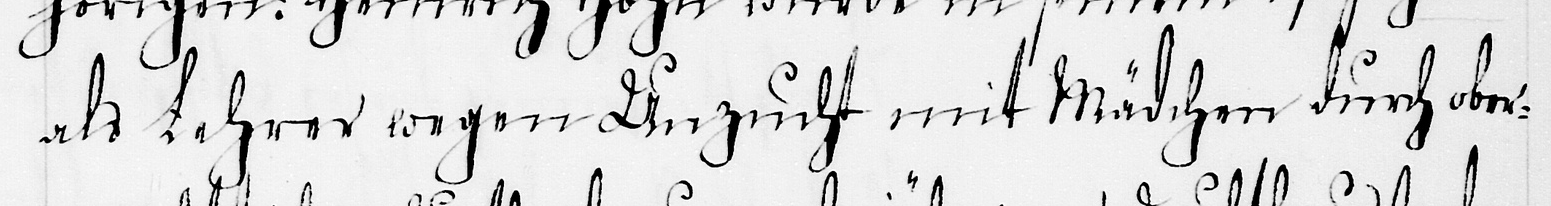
als Lehrer wegen Unzucht mit Mädchen durch ober¬
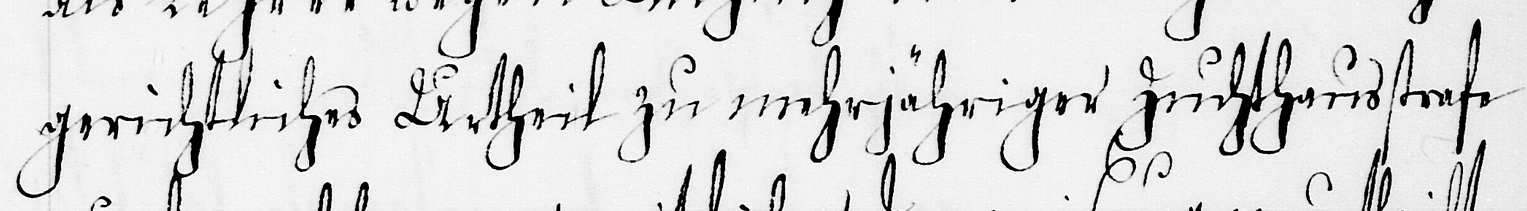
gerichtliches Urtheil zu mehrjähriger Zuchthausstrafe
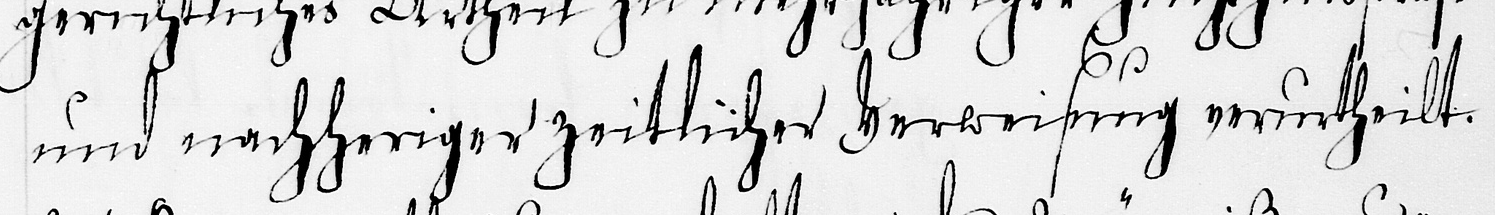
und nachheriger zeitlicher Verweisung verurtheilt.
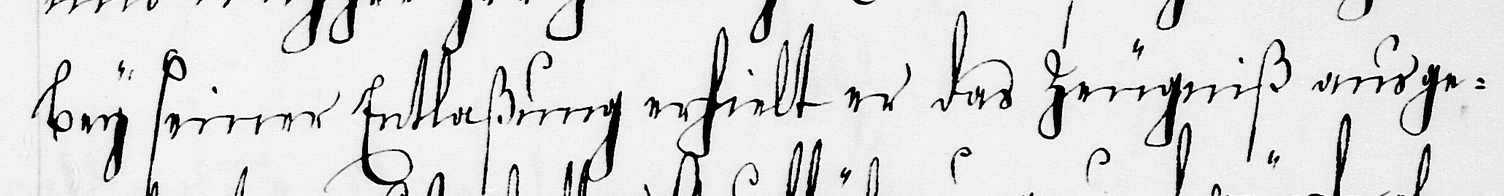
Bey seiner Entlaßung erhielt er das Zeugniß ausge¬
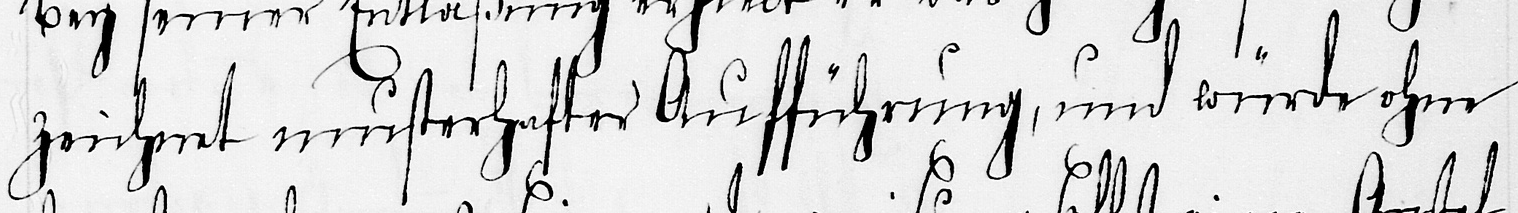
zeichnet musterhafter Aufführung, und würde ohne
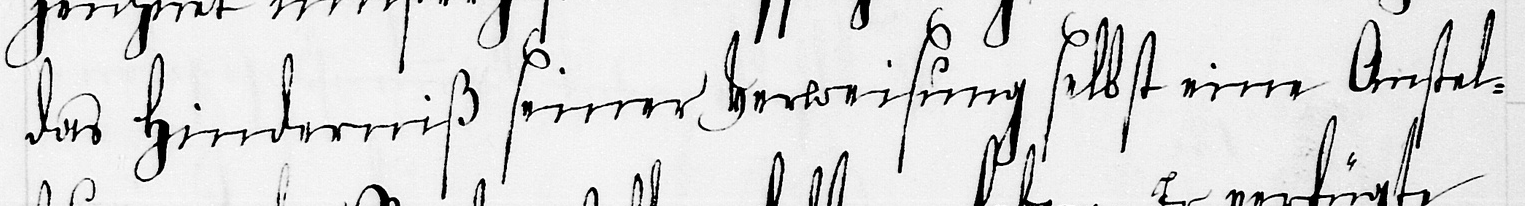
das Hinderniß seiner Verweisung selbst eine Anstel¬
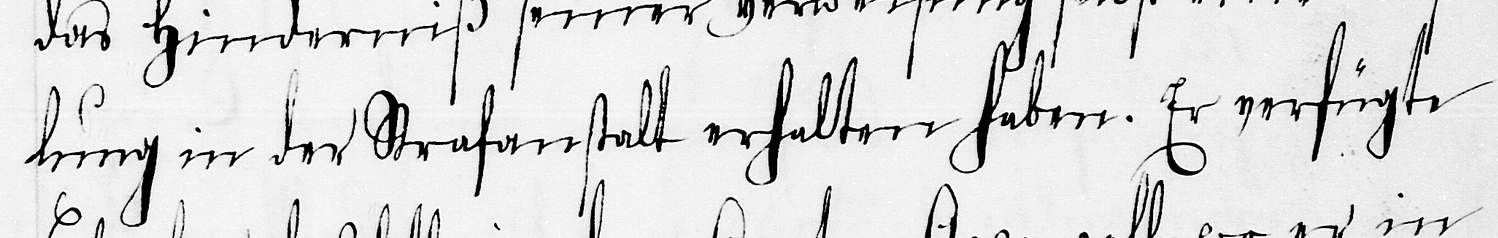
lung in der Strafanstalt erhalten haben. Er verfügte
